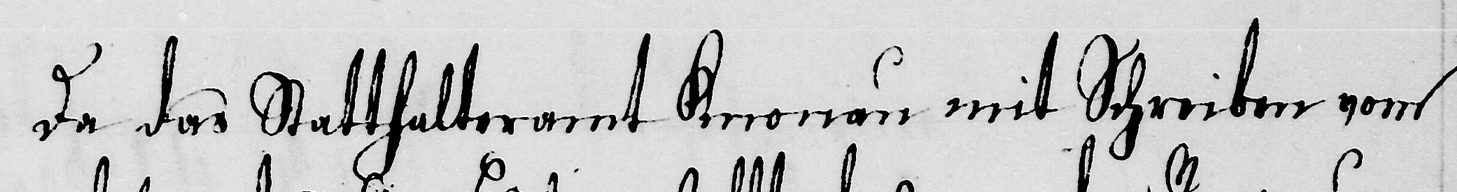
Da das Statthalteramt Knonau mit Schreiben vom
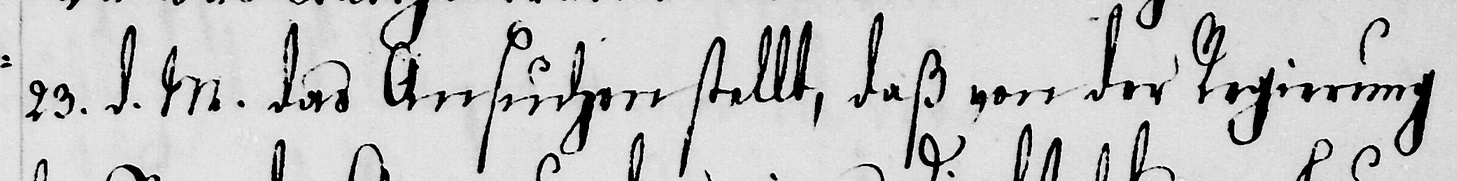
23. d. M. das Ansuchen stellt, daß von der Regierung
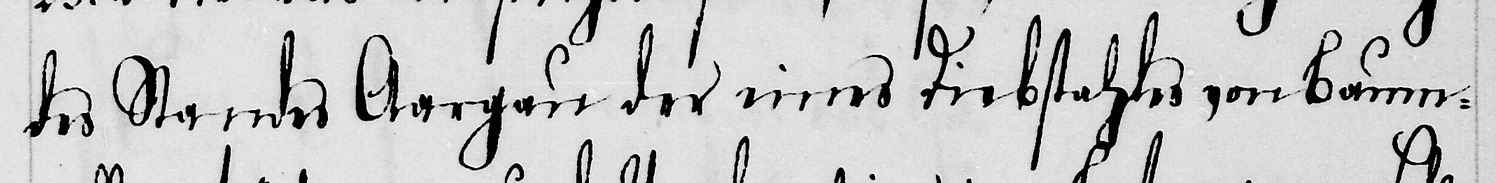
des Standes Aargau der eines Diebstahles von Baum¬
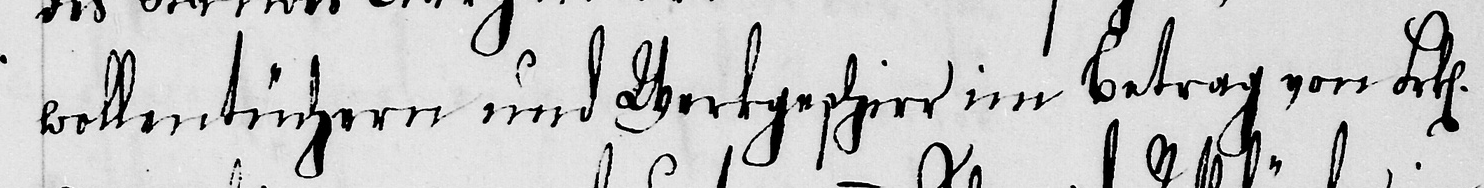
wollentüchern und Werkgeschirr im Betrag von Frk[e¬
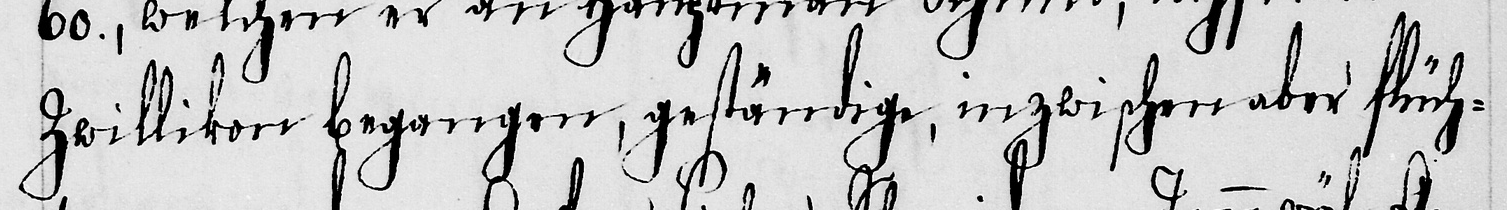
Zwillikon begangen, geständige, inzwischen aber flüch¬
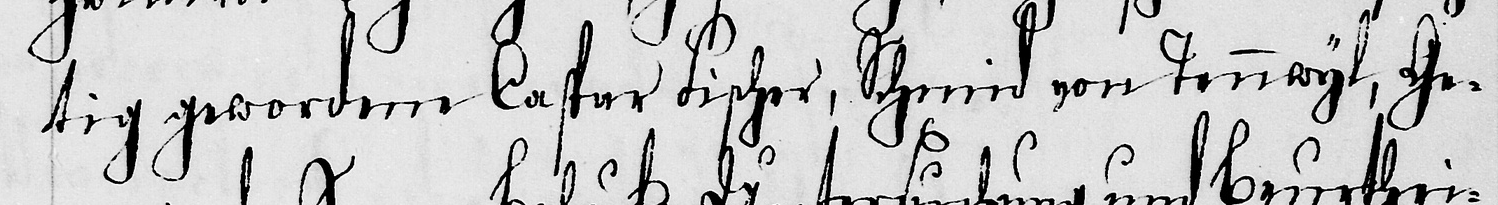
tig gewordene Caspar Fischer, Schmid von Tennwyl [s¬
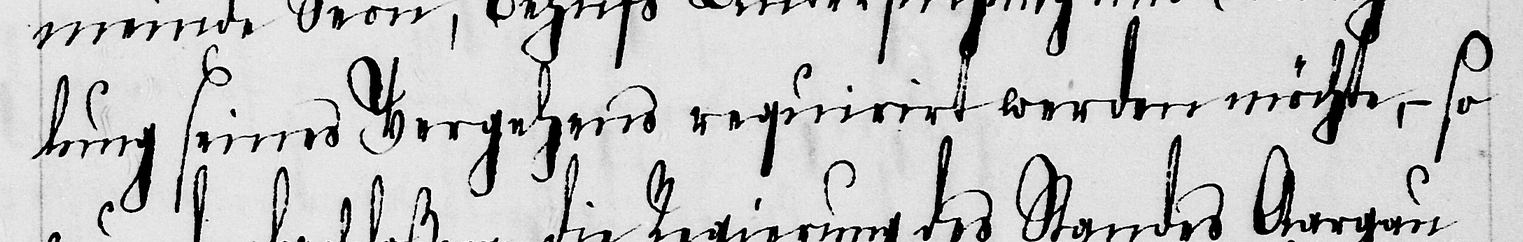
lung seines Vergehens requirirt werden möchte, – so
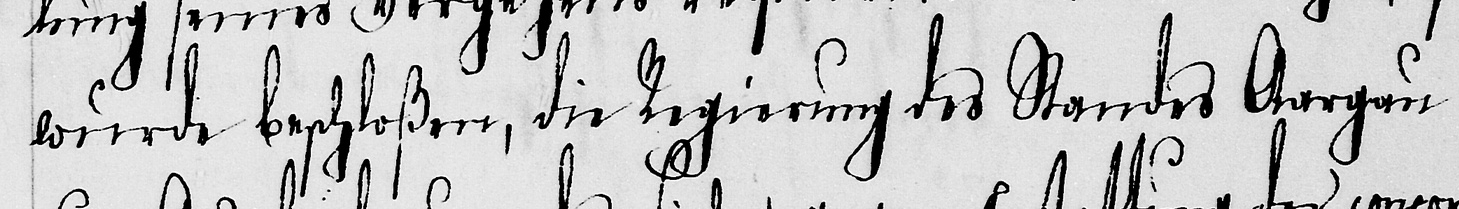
wurde beschloßen, die Regierung des Standes Aargau
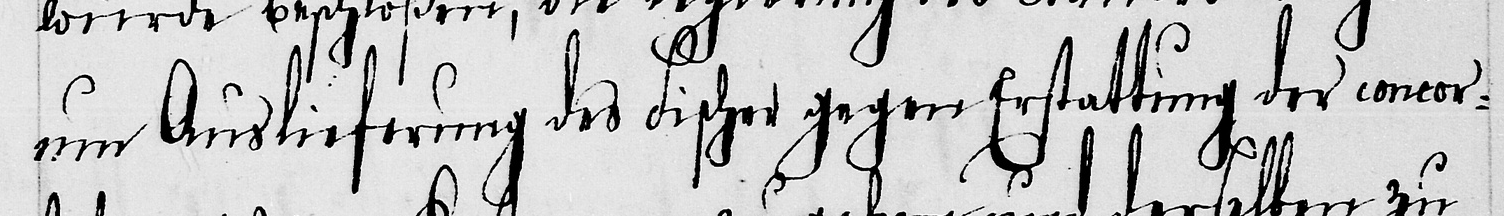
um Auslieferung des Fischer gegen Erstattung der concor¬
